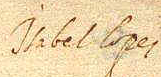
Isabel lopes
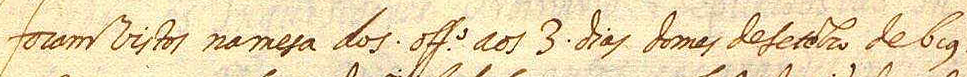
Foram vistos na mesa do s. off.o aos 3 dias do mes de setēbro de 619
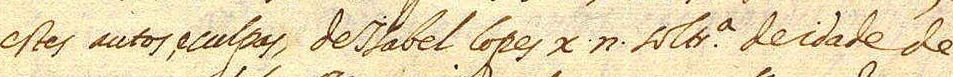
estes autos, e culpas, de Isabel lopes x. n. soltr.a de idade de
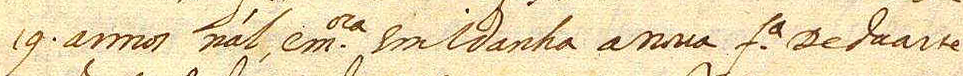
19 annos nāl, e m.ora Em idanha a noua f.a De duarte
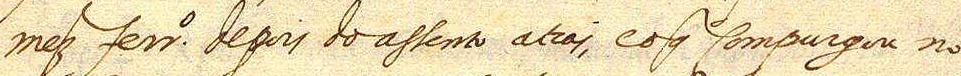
mez̄ ferr.o depois do assento atras, e o q̄ Compurgou no
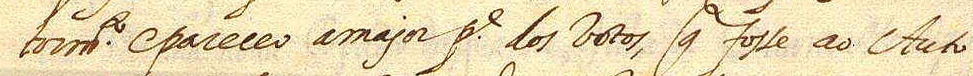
torm.to e pareceo a major p.e dos votos, q̄ fosse ao Auto
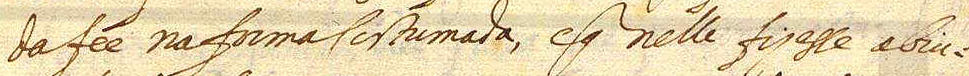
da fee na forma Costumada, e q̄ nelle fizesse abiu
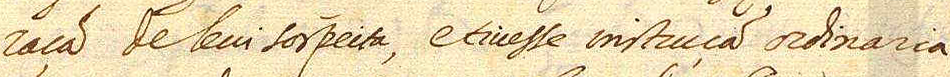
raçaõ de leui sospeita, e tiuesse instruçaõ ordinaria
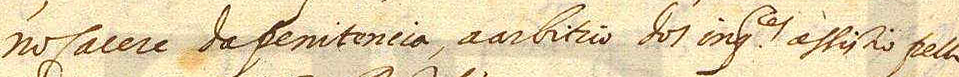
no Cacere da penitencia, a arbitrio dos inq.res assistio pello
